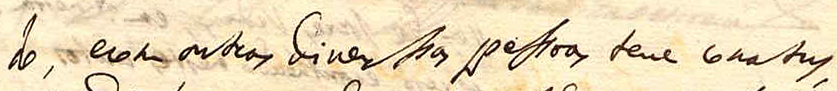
do, e com outras diuerssas pessoas teue conatus,
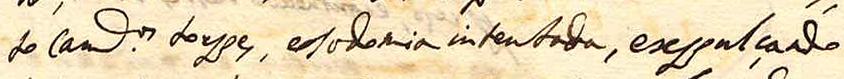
tocamt.os torpes, e sodomia intentada, expulçando
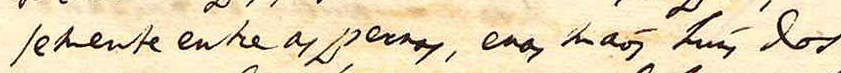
semente entre as pernas, e nas maõs huns̄ dos
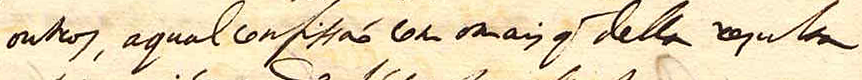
outros, a qual confissaõ com mais q̄ della rezulta
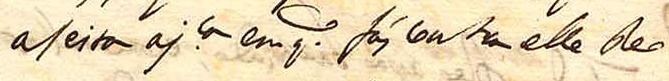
aseita a j.ca emq̄to fás contra elle Reo
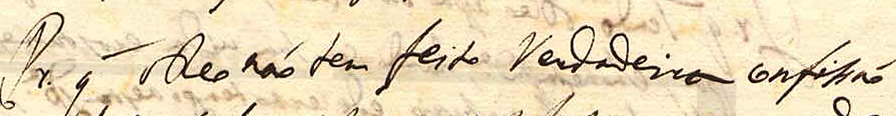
Pr. q̄ o Reo naõ tem feito Verdadeira confissaõ
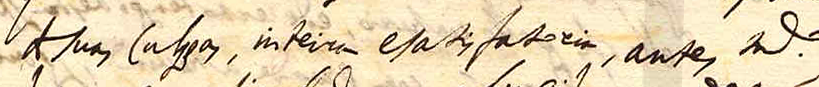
d̄ suas Culpas inteira e satisfatoria, antes m.to
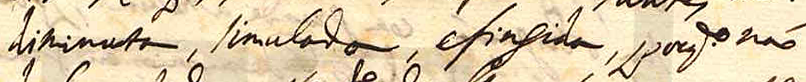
diminuta, simulada, e fingida, porq.to naõ
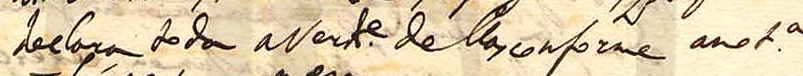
declara toda a verd.e dellas conforme a not.a
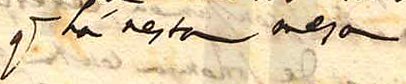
q̄ há nesta mesa
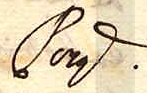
Porq.o.
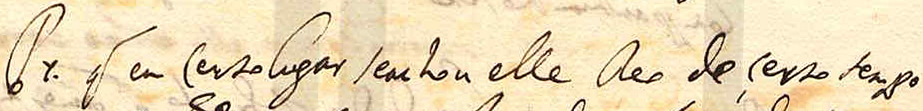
Pr. q̄ em Certo lugar se achou elle Reo de çerto tempo
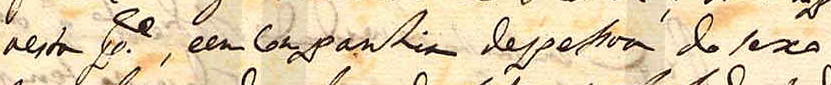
a esta p.te, e em companhia de pessoa do sexo
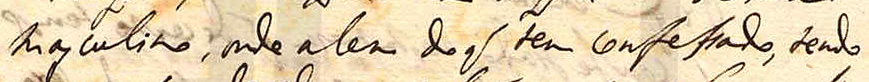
masculino, onde alem do q̄ tem confessado, tendo
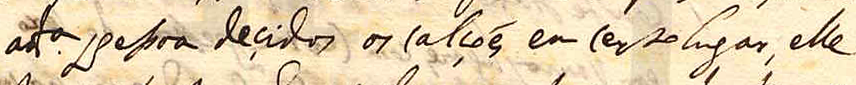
a d̄a. pessoa deçidos os calçoẽs en certo lugar, elle
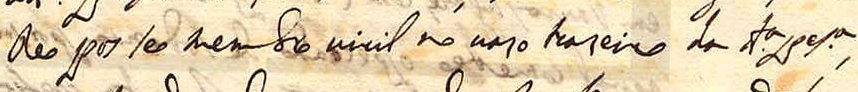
Reo pos seo membro uiril no uazo trazeiro da d̄a pes.a,
